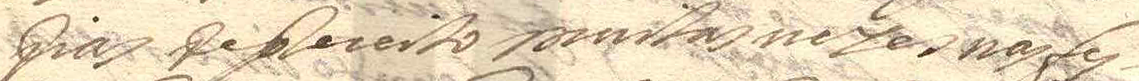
dias de preceito muitas uezes nas fes
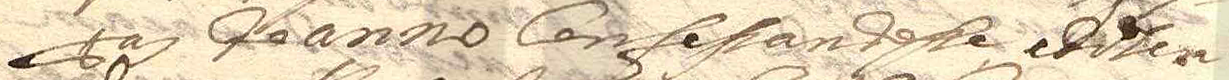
tas do anno Confessandosse, e diZen
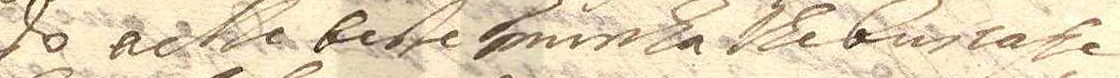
do a elle testemunha lhe buscasse
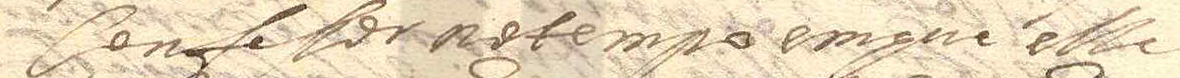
confesor no tempo em que elle
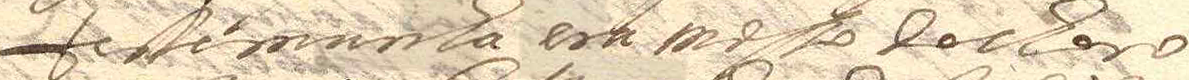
testemunha era mosso do choro
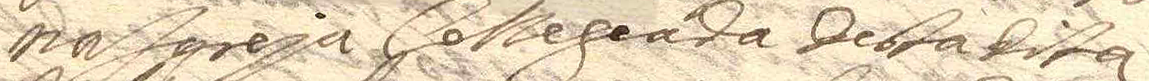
na Jgreja Collegeada desta dita
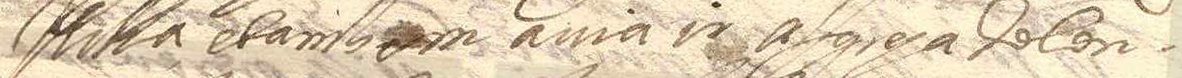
Villa e tambem a uia ir a Jgreja do Con
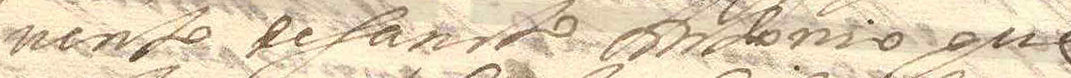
uento de santo Antonio que
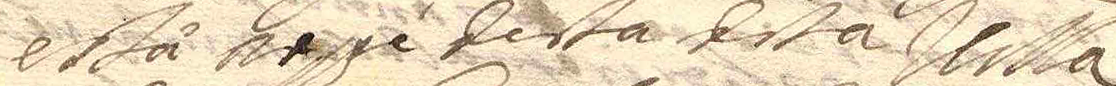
está no pé desta dita Villa
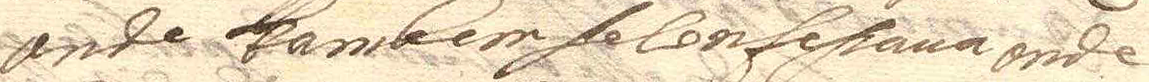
onde tambem se confessaua onde
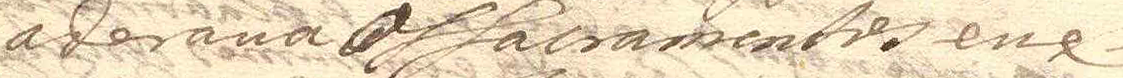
adoraua os sacramentos e ue
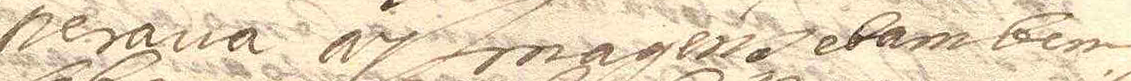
neraua as Jmagens e tambem
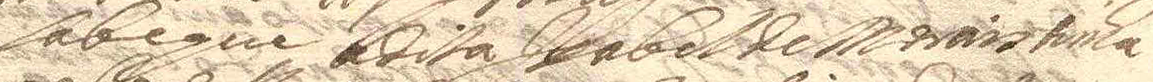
sabe que a dita Izabel de Morais tinha
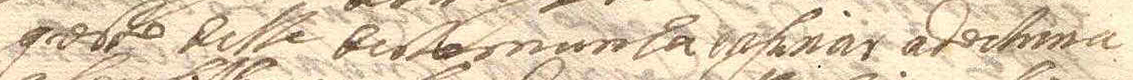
gosto delle testemunha enssinar a doctrina
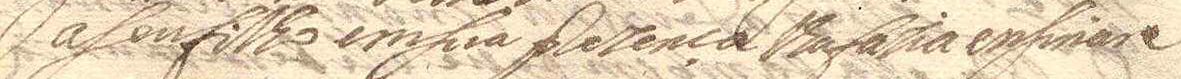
a seu filho em sua prezença lha fazia ensinar e
